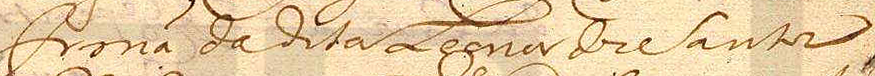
Jrmã da dita Leonor dos Santos
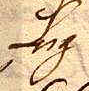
Lug
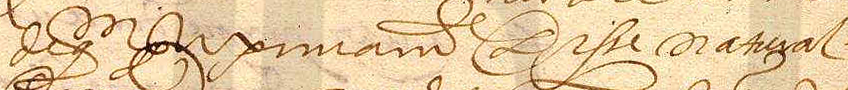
de qm pRoximamte Disse natural
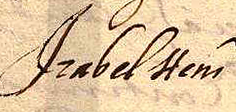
Jzabel Hens̄
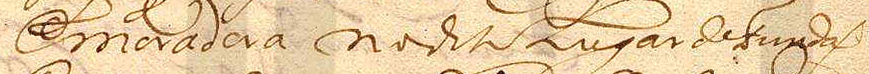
E moradora no dito Lugar de Fundaꝭ
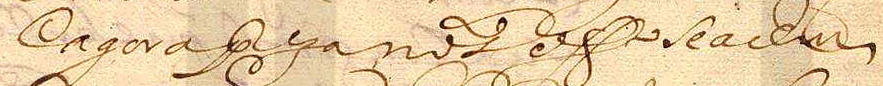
E agora pReza no s.to offo se achou
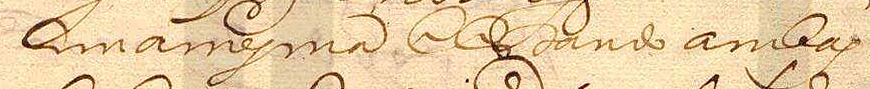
Com a mesma E Estando ambas
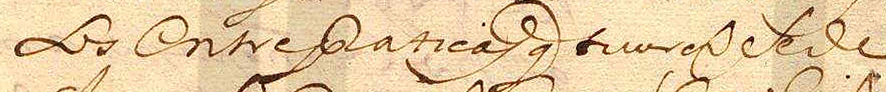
Sos Entre pRaticas q̄ tiueraꝭ se de
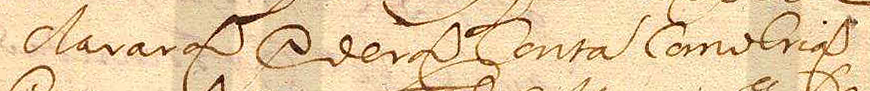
clararaꝭ E deraꝭ Conta Como Criaꝭ
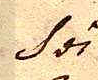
Sós
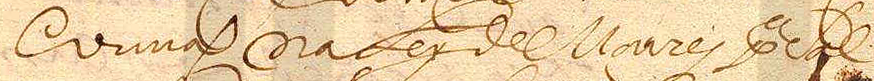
E viuiaꝭ na Ley de Mouzes pa sal
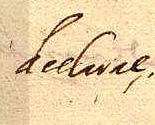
declaraç.
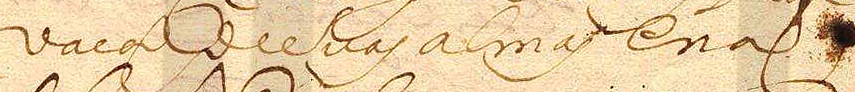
vaçaꝭ de Suas almas e naõ
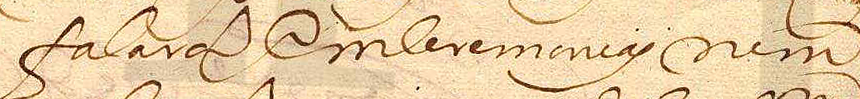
falaraꝭ em Ceremonias nem
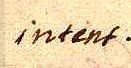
intent.
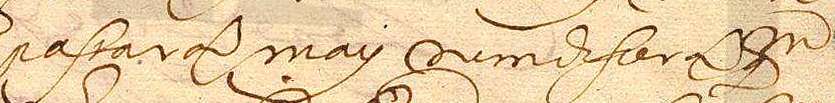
passaraꝭ mais nem disseraꝭ qm
